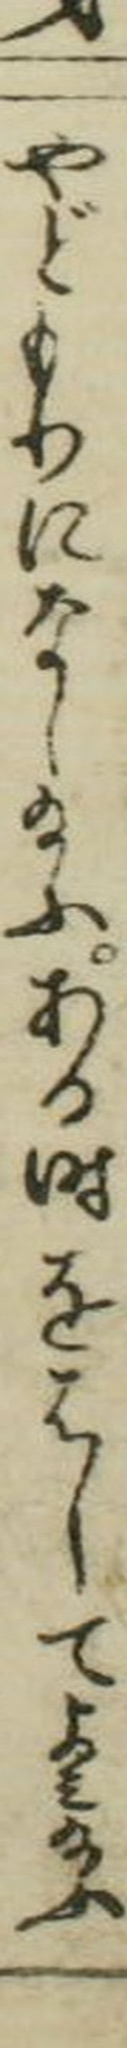やどもりになし給ふ。ある時をはしてよみ給ふ
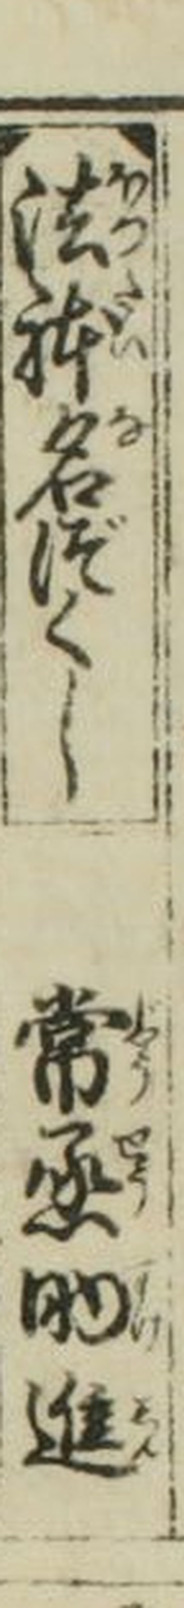法体名づくし常烝助進
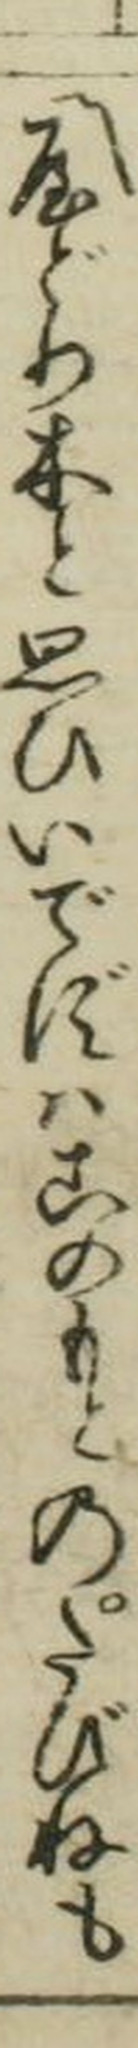〽やどり木と思ひいでずはこのもとの。たびねも
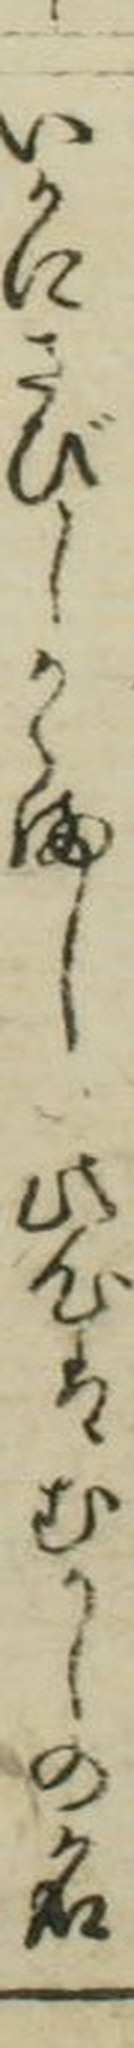いかにさびしからまし◯此心はむかしの名
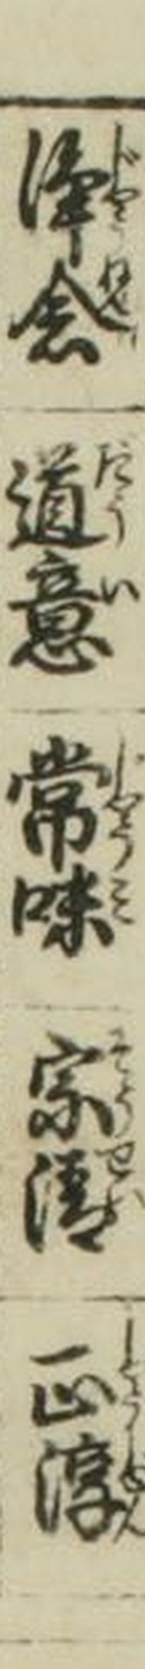浄念道意常味宗清正淳
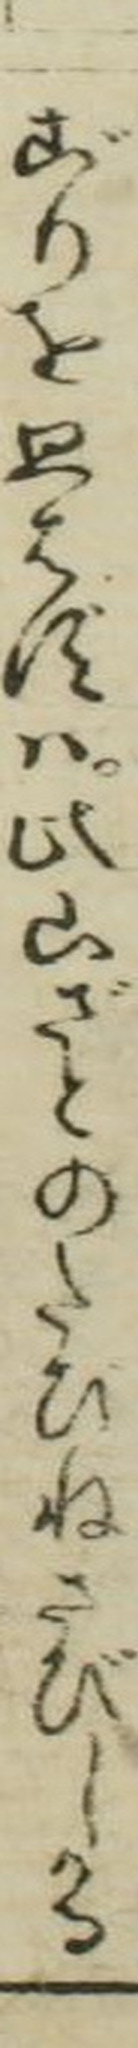ごりを思はずは。此山ざとのたびねさびしかる
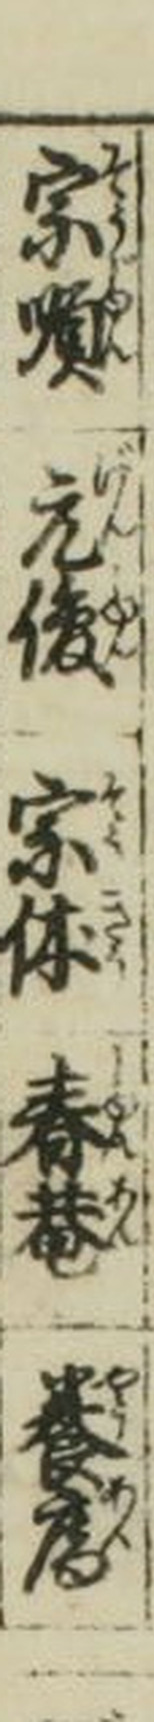宗順元俊宗休春菴養庵
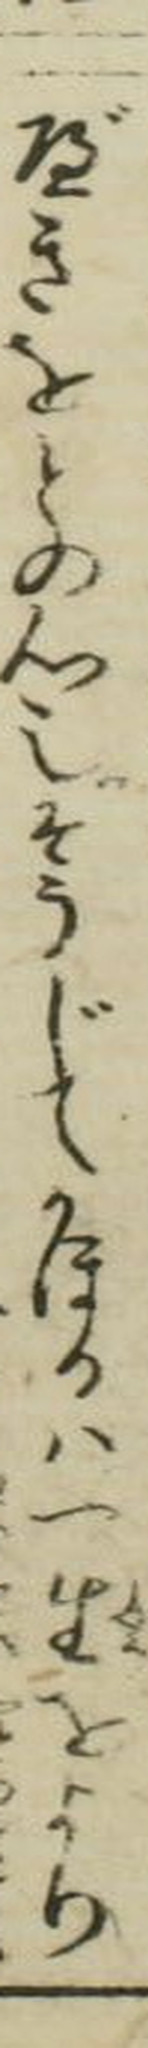べきをとの心也。そうじてかほるは一生をより
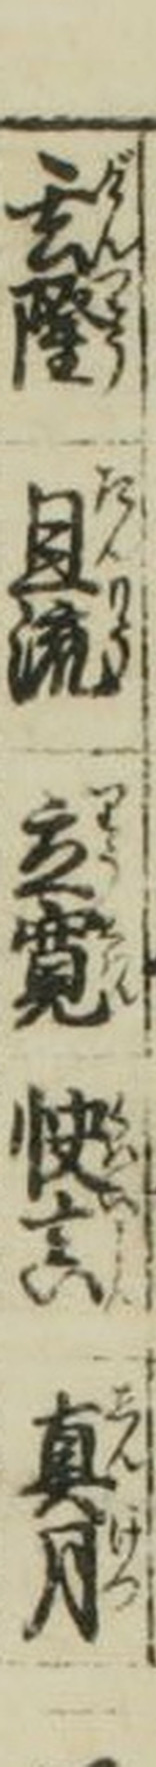玄隆旦流立寛快真真月
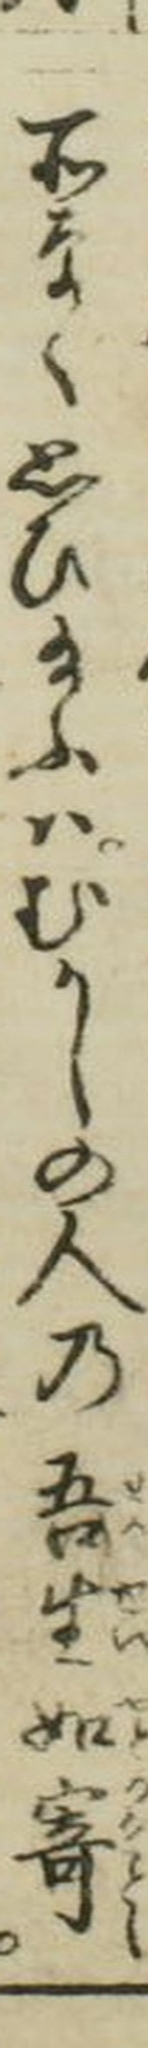所なく思ひ給ふは。むかしの人の吾生如寄
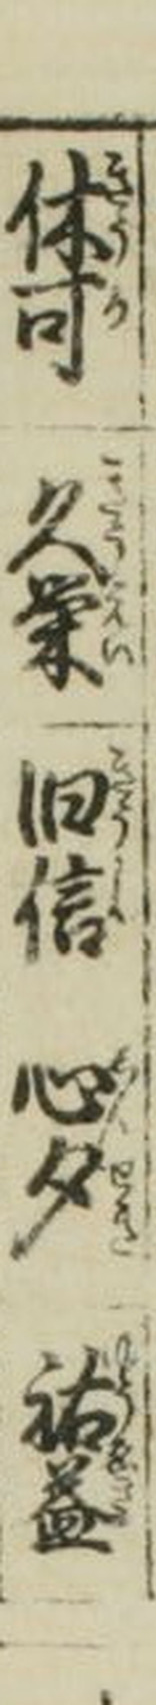休可久栄旧信心夕祐益
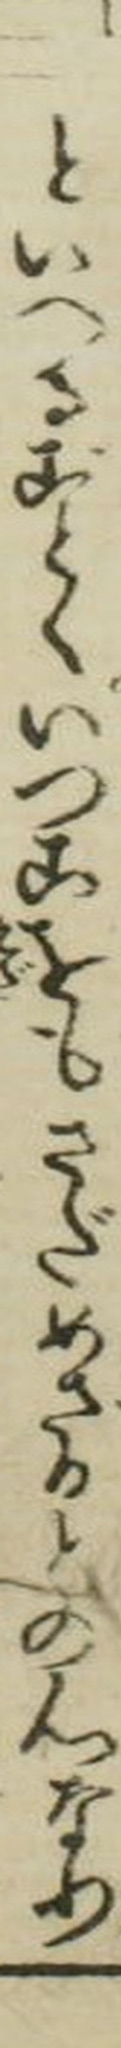といへるごとく。いつこをもさだめざるとの心なり。
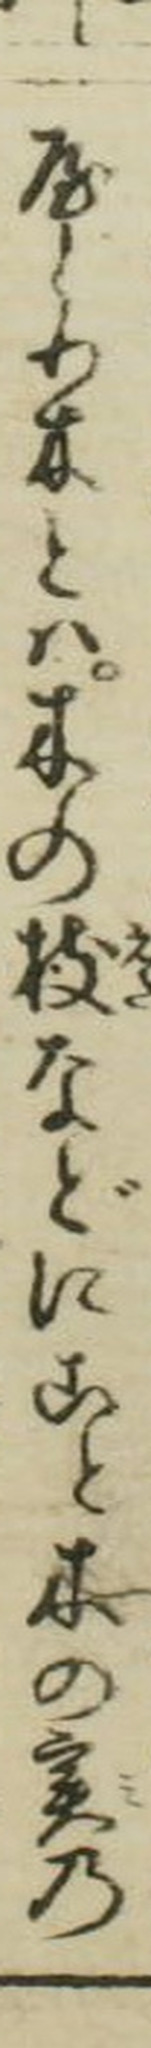やどり木とは。木の枝などにこと木の実の
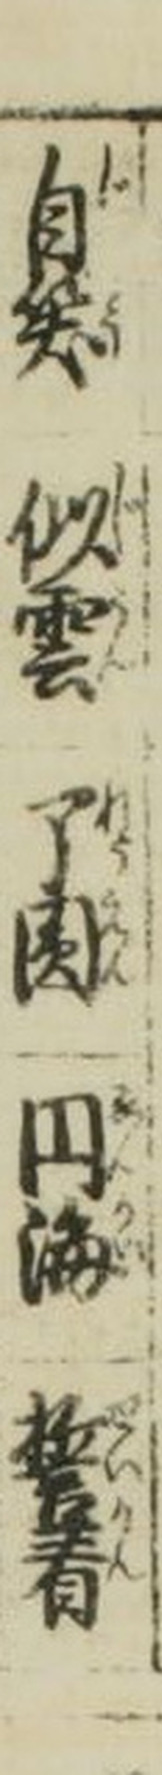自笑似雲了円円海誓看
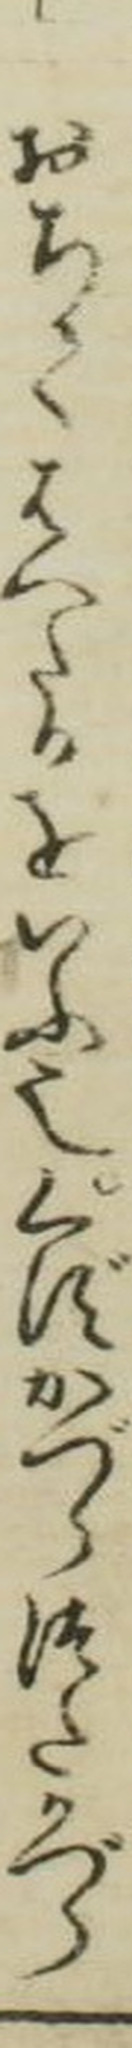おちてはへたるをいふ也。くずかづらつたかづら
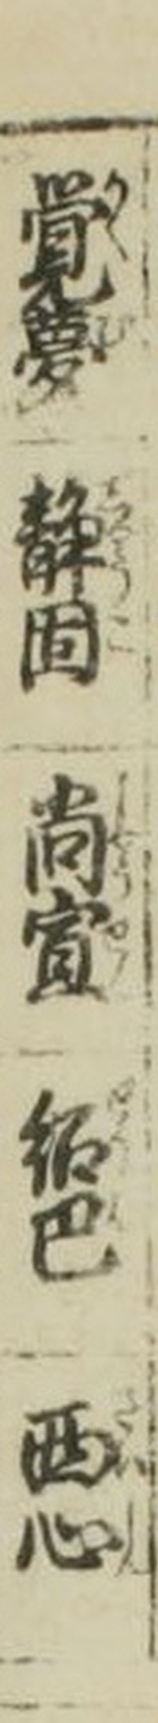覚夢静固尚宣紹巴西心
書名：女源氏教訓鑑
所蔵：東京学芸大学附属図書館
